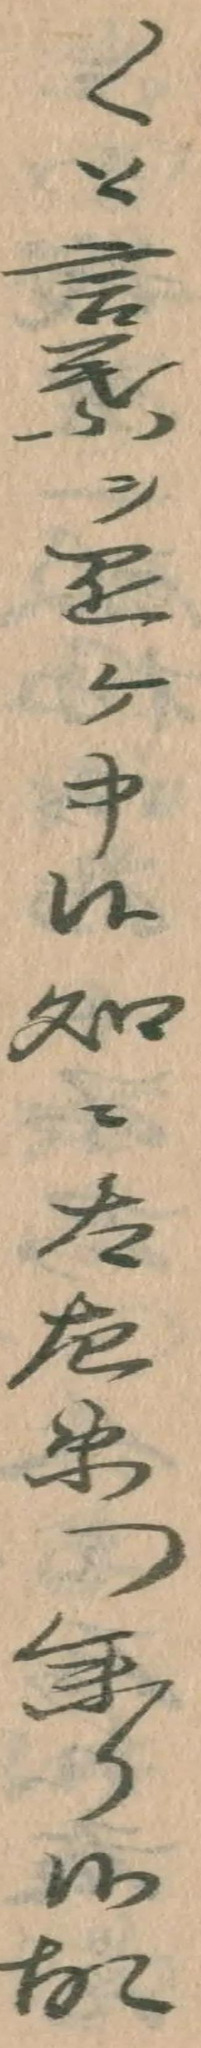〱と言葉を懸け申候処に太左衛門参り候故
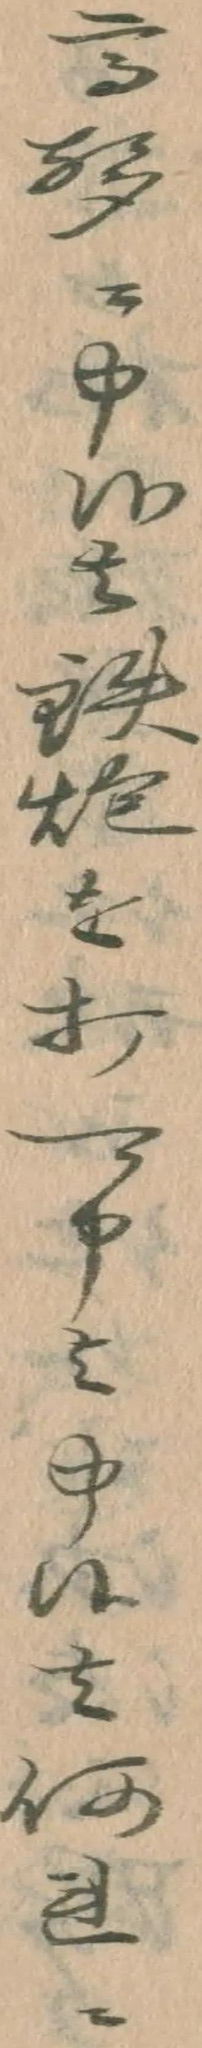高声に申候者鉄炮を打可申与申候者何連に
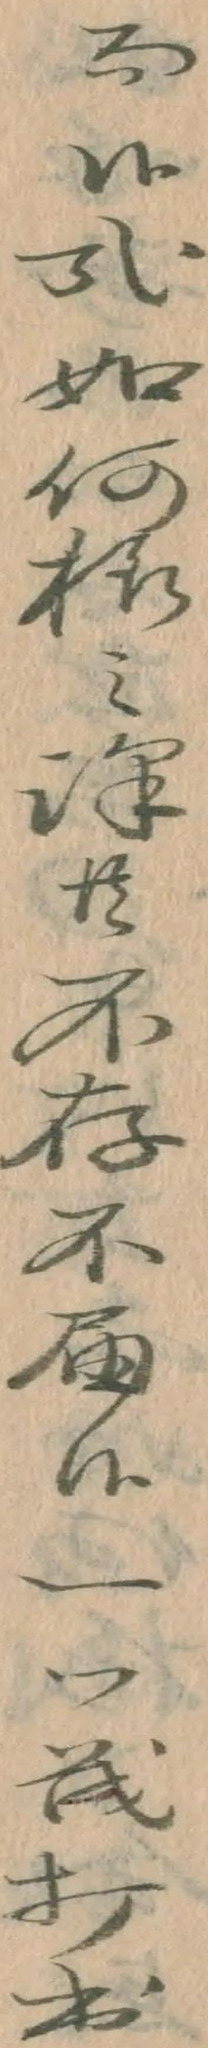而候哉如何様之訳共不存不届候一つ茂打出
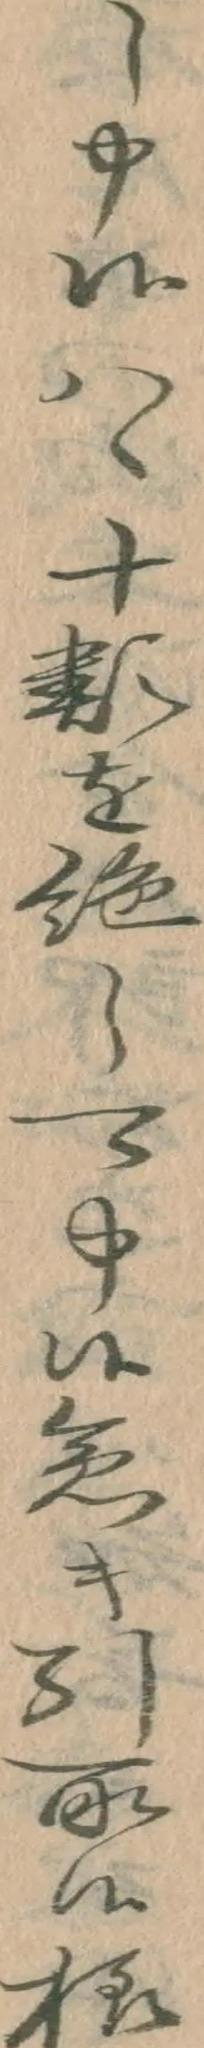し申候はゝ十類を絶し可申候急き引取候様
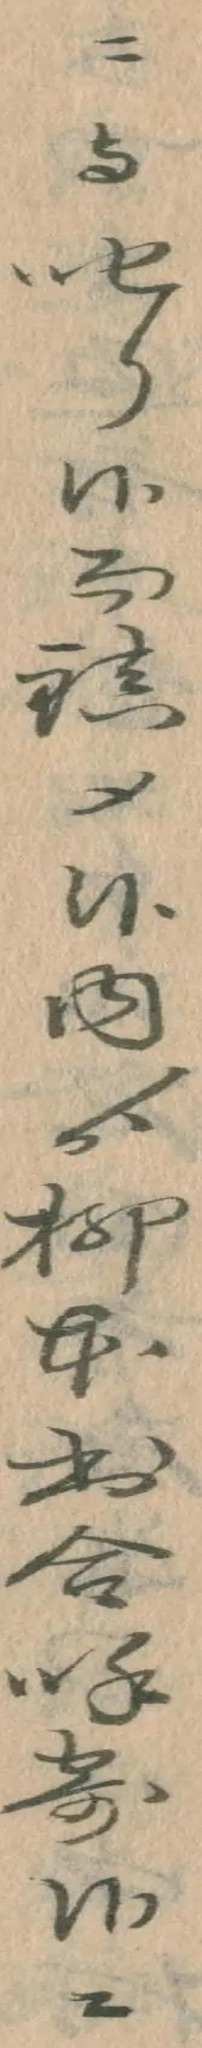に与叱り候而鎮め候内ゟ柳本出合呼寄候に
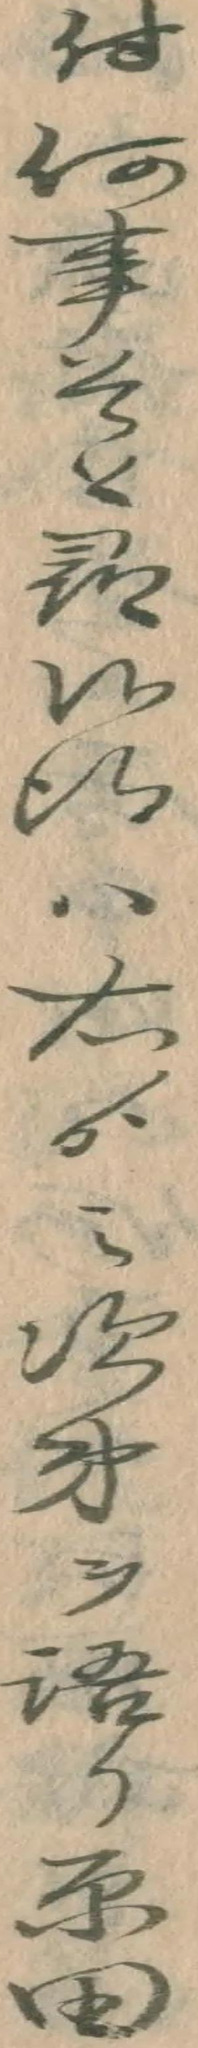付何事そと尋候得は右ゟ之次第を語り原田
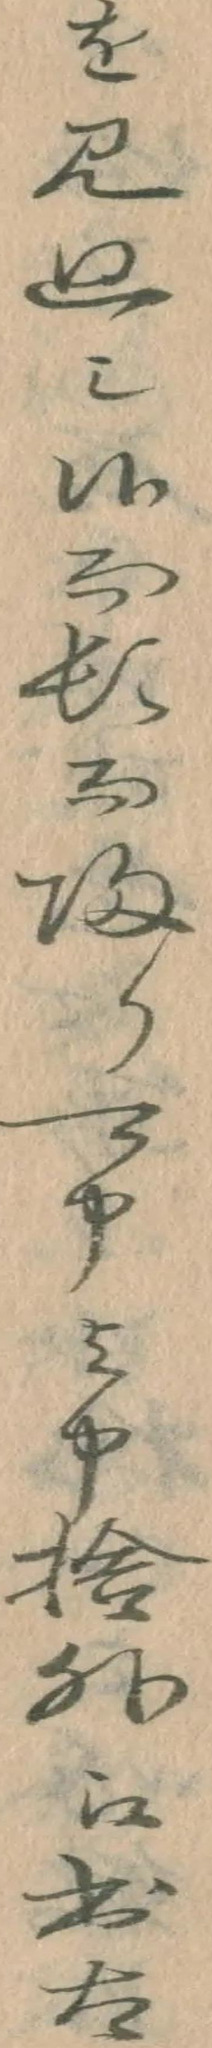を見廻し候而頓而帰り可申与申捨外江出太
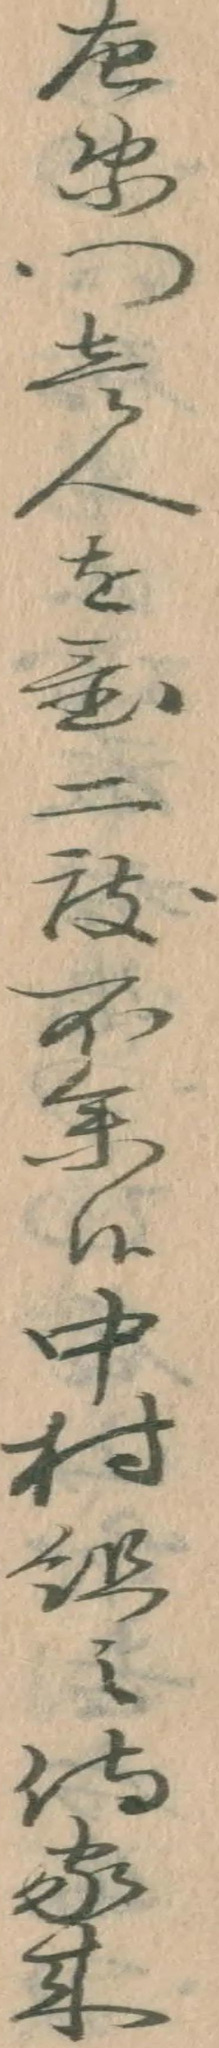左衛門壱人を置二度不参候中村組之侍家来
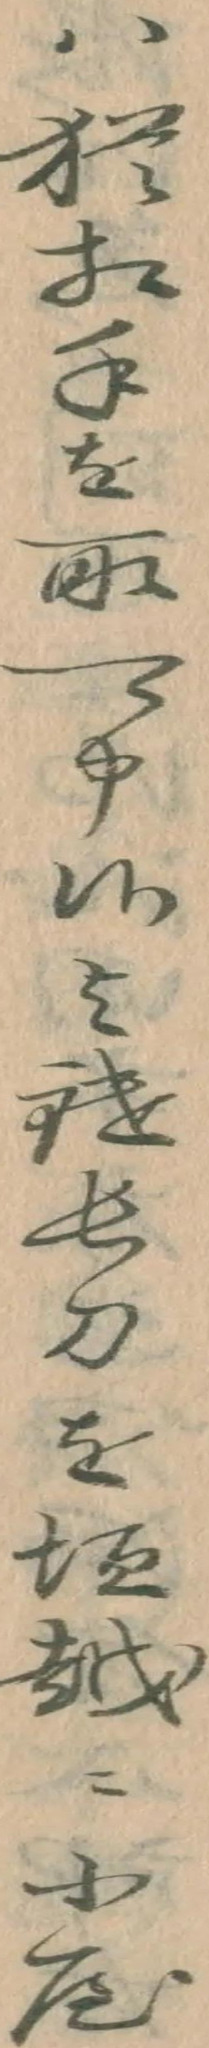は猶相手を取可申候与鑓長刀を垣越に小屋
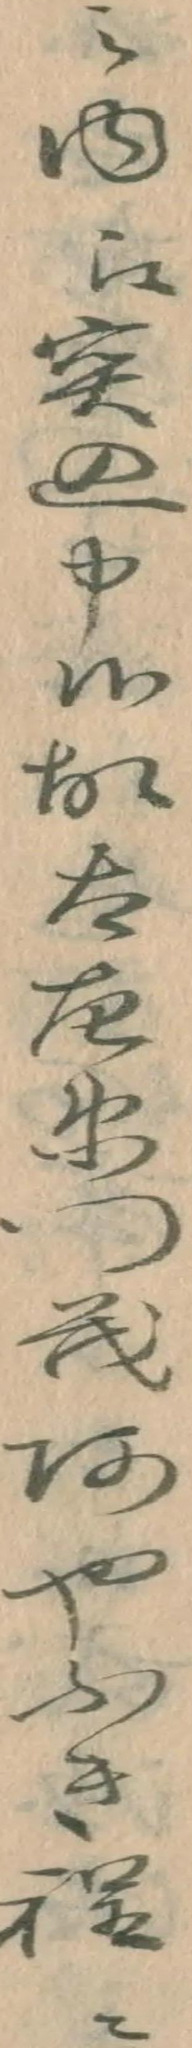之内江突込申候故太左衛門茂阿やふき程に

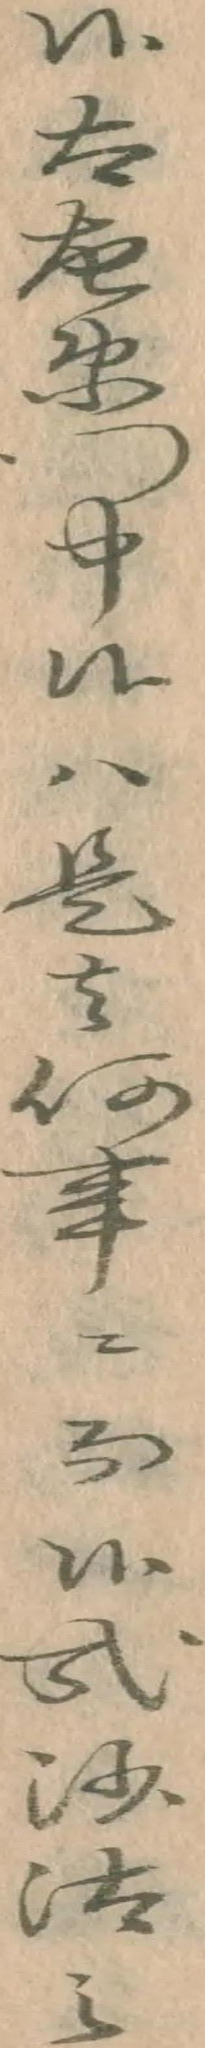候太左衛門申候は是者何事に而候哉沙汰之
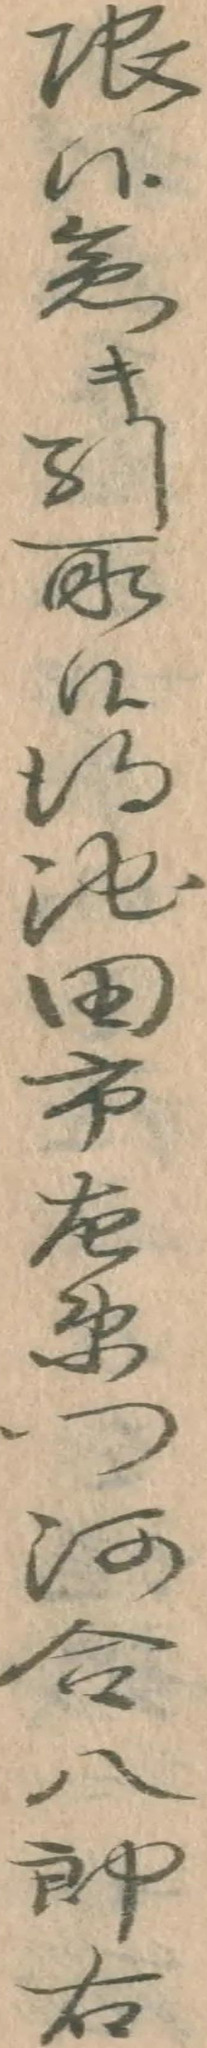限候急き引取候得池田市左衛門河合八郎右
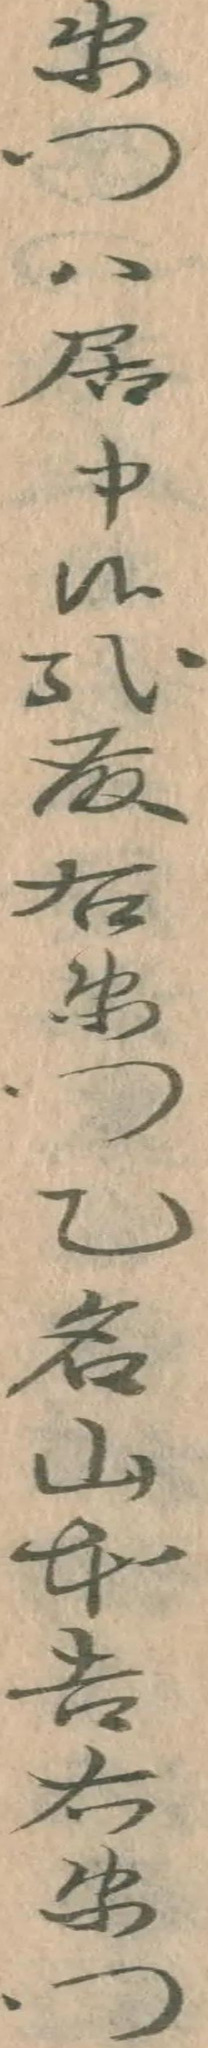衛門は居申候哉藤右衛門乙名山本吉右衛門
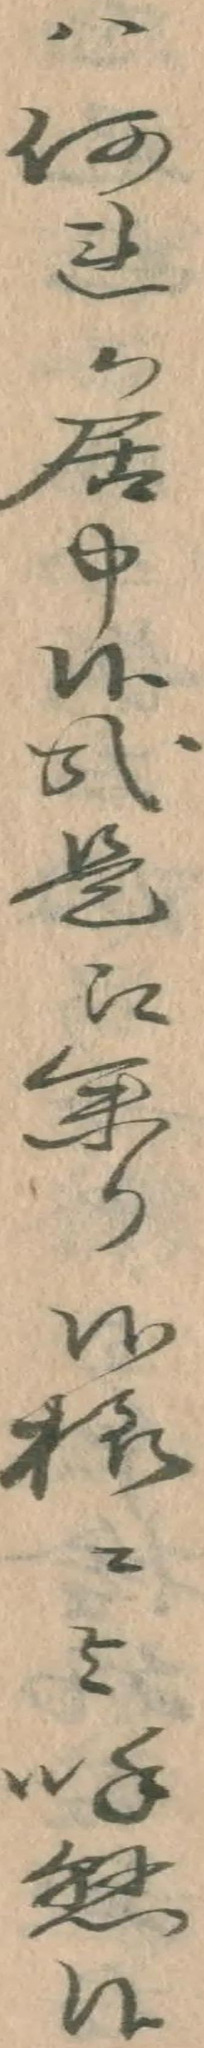は何連か居申候哉是江参り候様に与呼懸候
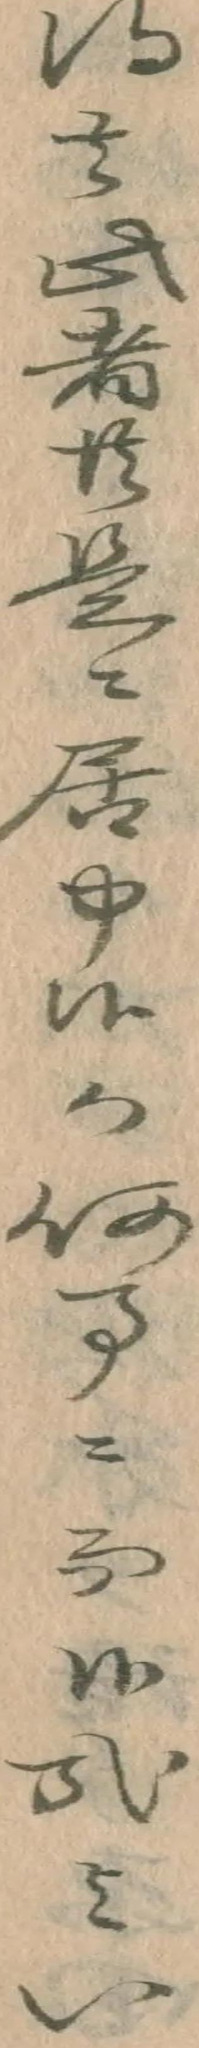得者此者共是に居申候か何事に而候哉与い
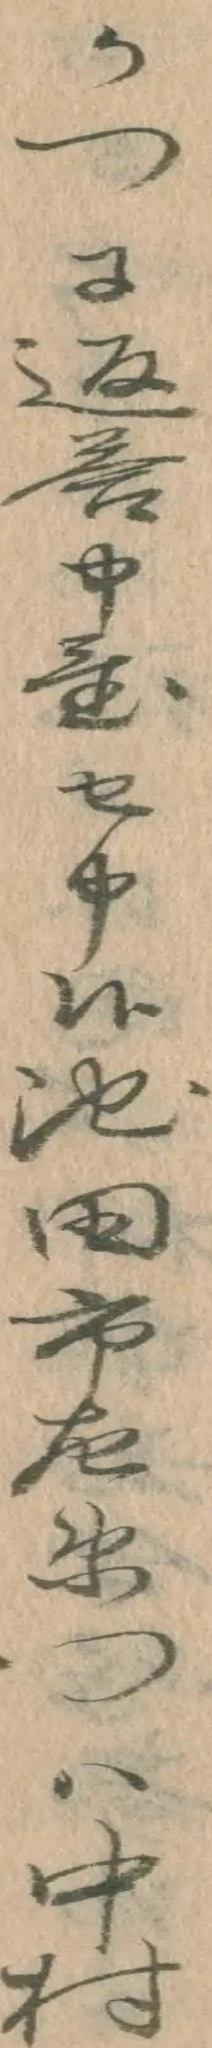かつ尓返答申置せ申候池田市左衛門は中村
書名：切支丹御退治記 49巻. [4]
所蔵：国立国会図書館 National Diet Library, JAPAN
